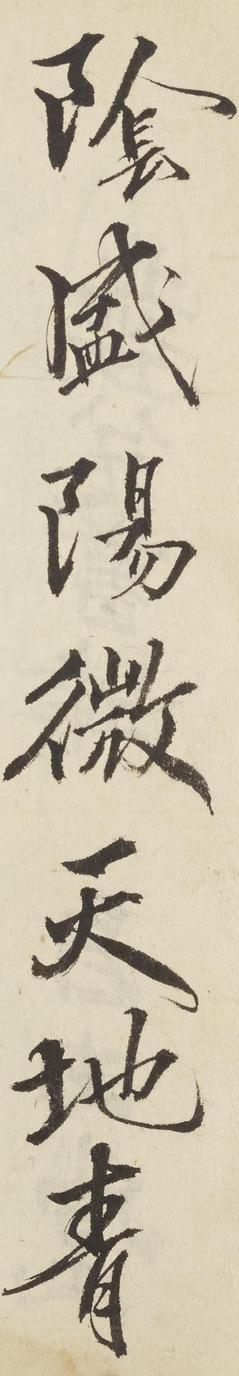陰盛陽微天地青
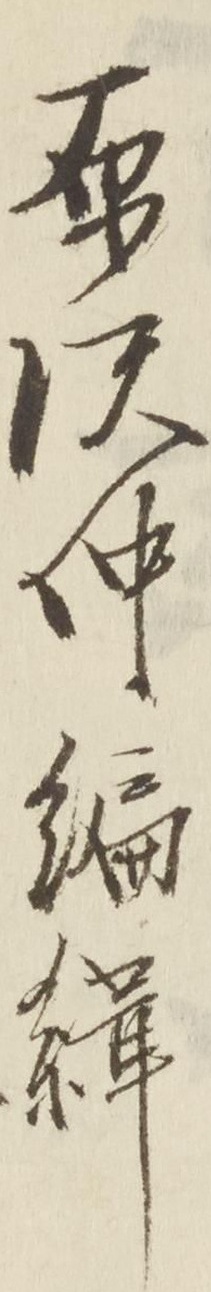原沢仲編輯
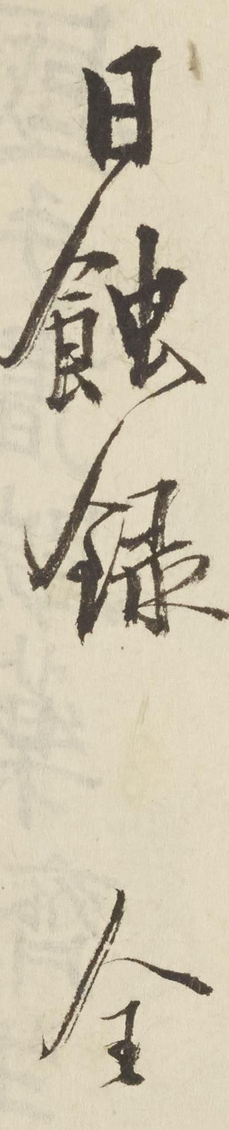日蝕録全

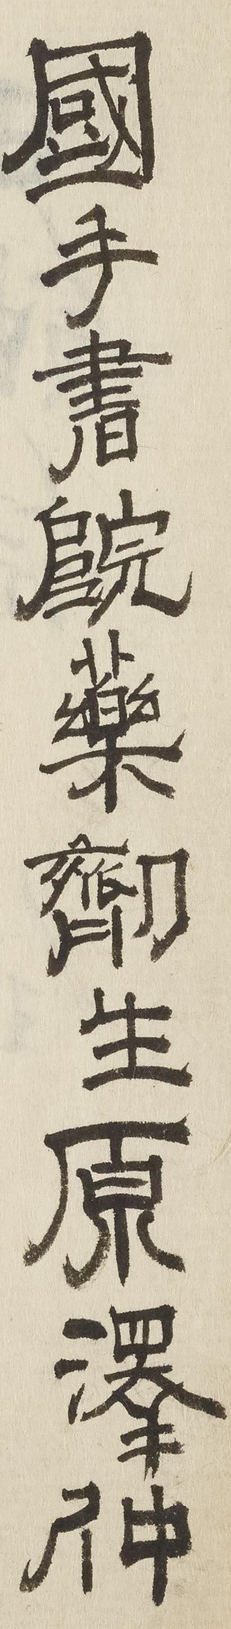国手書院薬剤生原沢仲
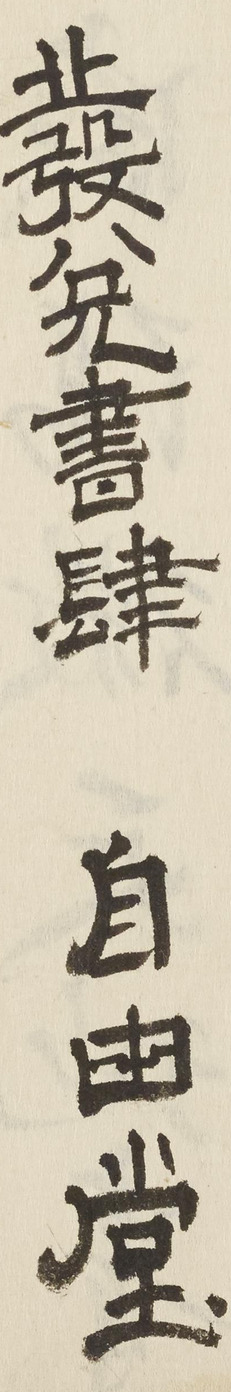発兌書肆自由堂
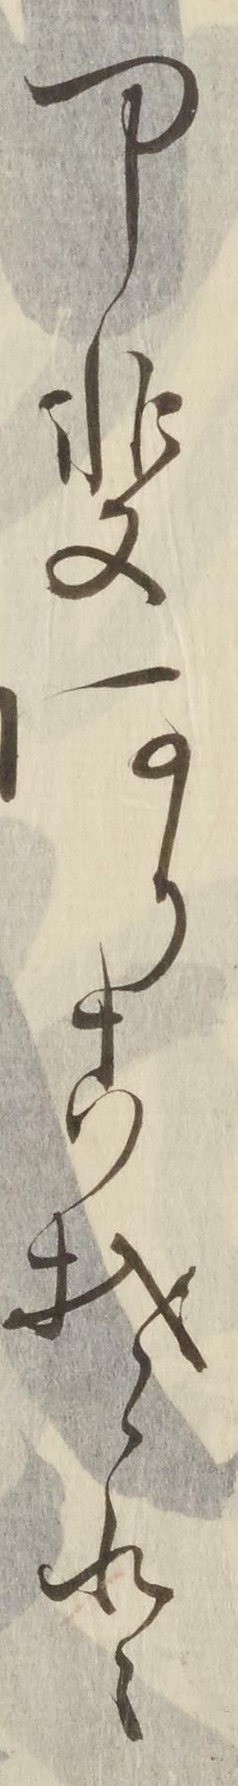甲斐ありこそと
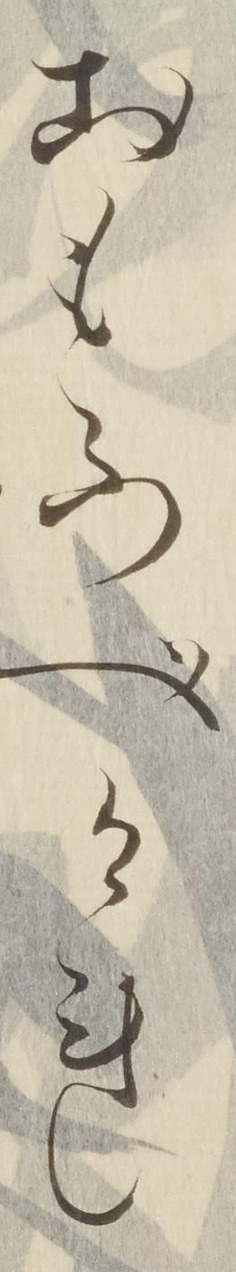おもふべけれ
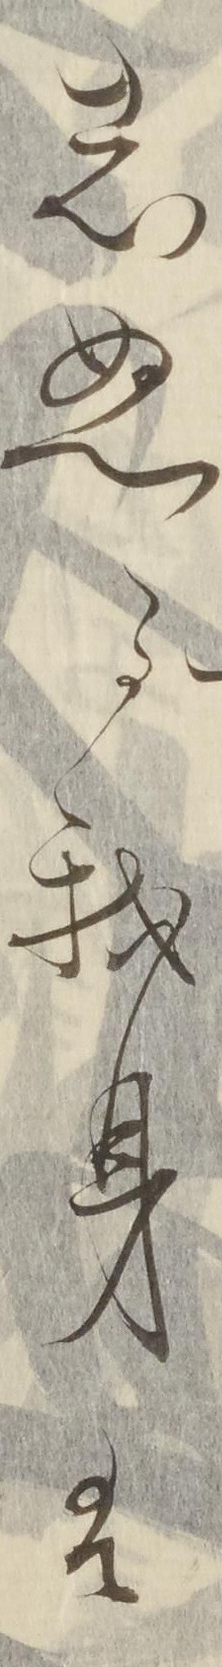しぬる我身は

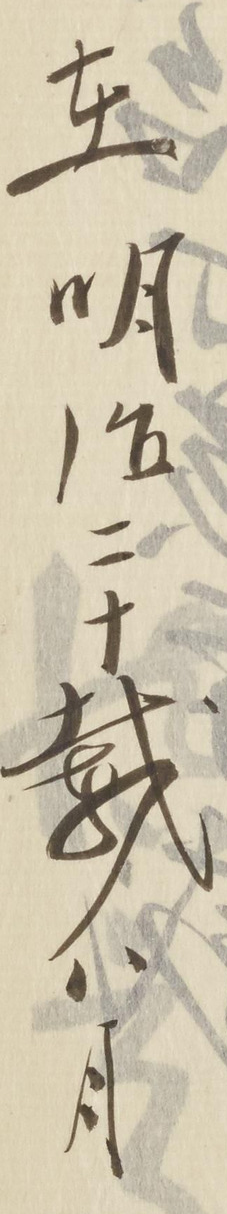在明治二十載八月

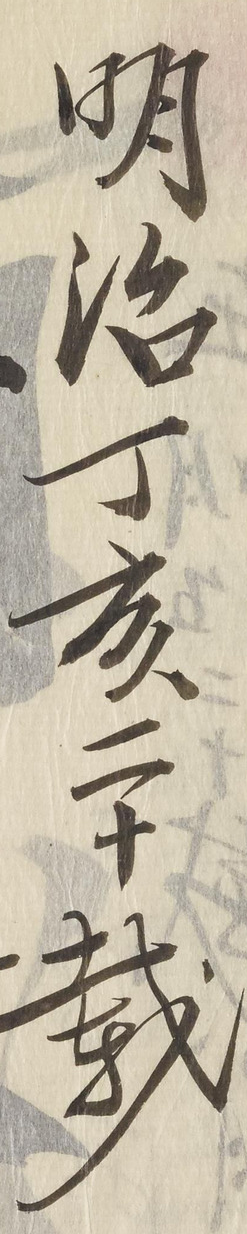明治丁亥二十歳
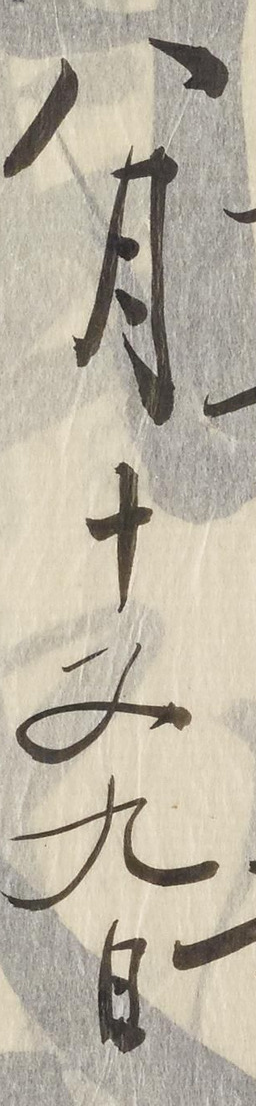八月十又九日
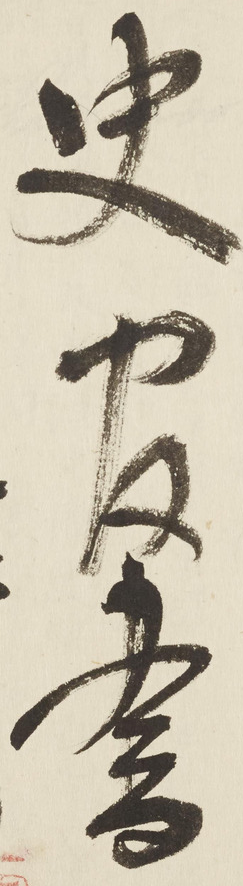史官書

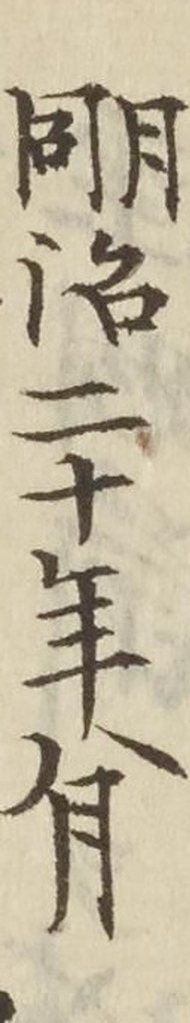明治二十年八月
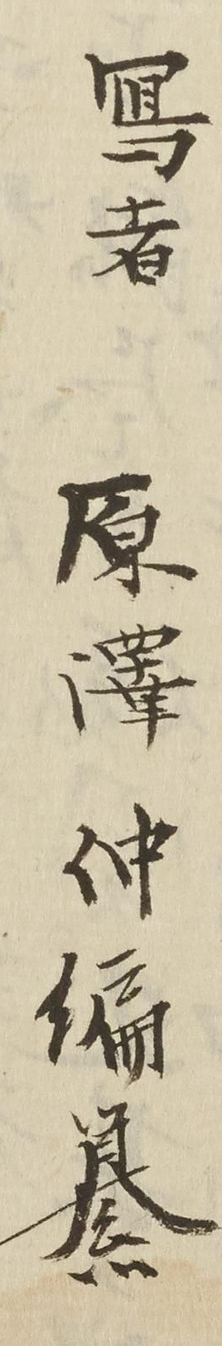写者原沢仲編纂
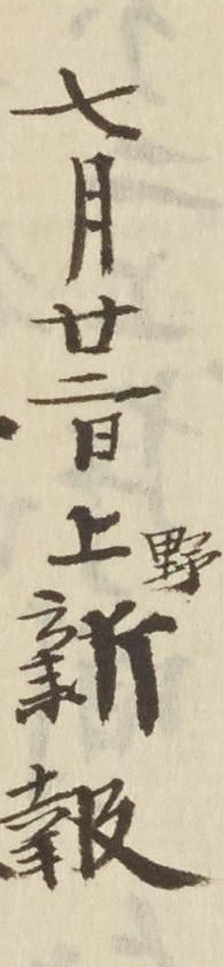七月廿二日上野新報
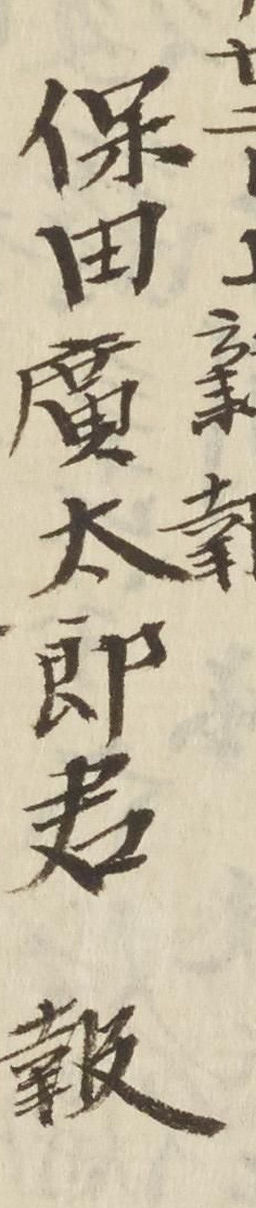保田広太郎君報
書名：日蝕録　全
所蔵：東京大学地震研究所図書室 Earthquake Research Institute Library, The University of Tokyo, JAPAN
